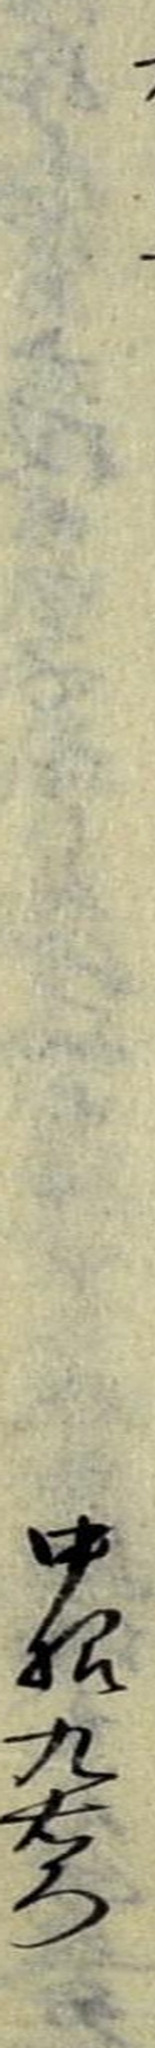中根九右衛門
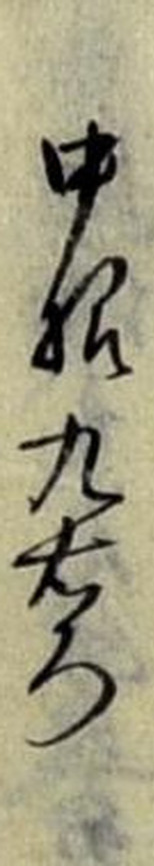中根九右衛門
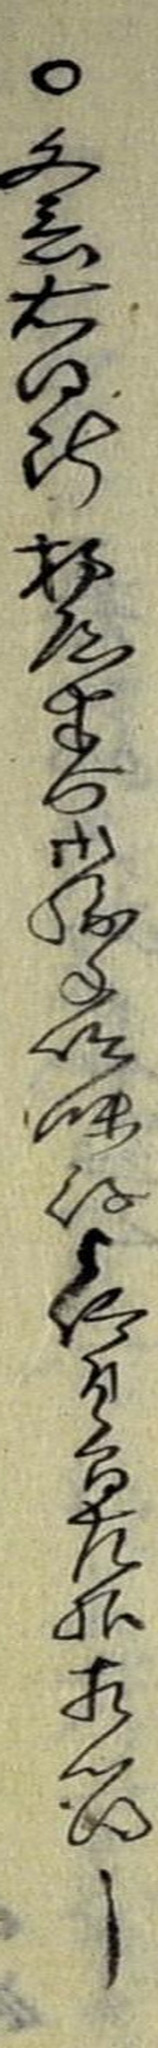〇文言右同断栃屋半右衛門御勝手吟味役被仰付候間左様相心得申候
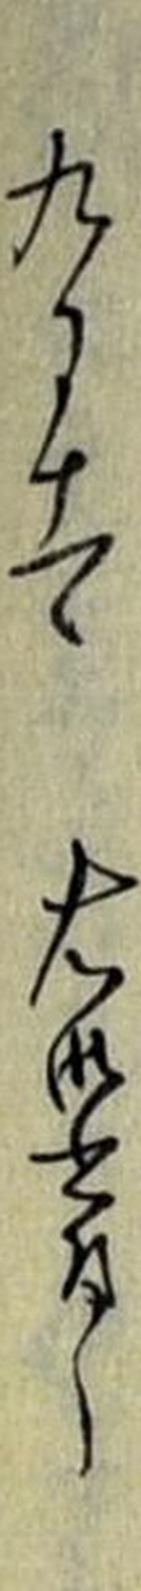九月十一日右御書付之
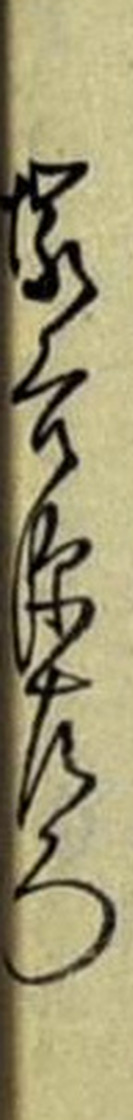塚谷源左衛門
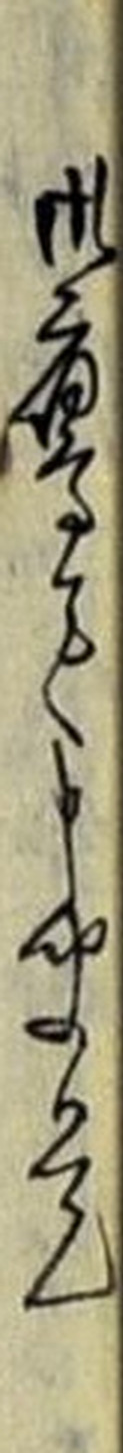御鷹方へ申聞覚
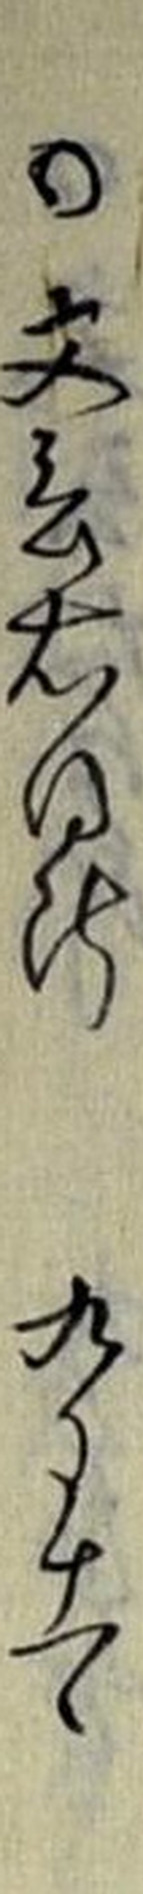〇文言右同断九月十一日
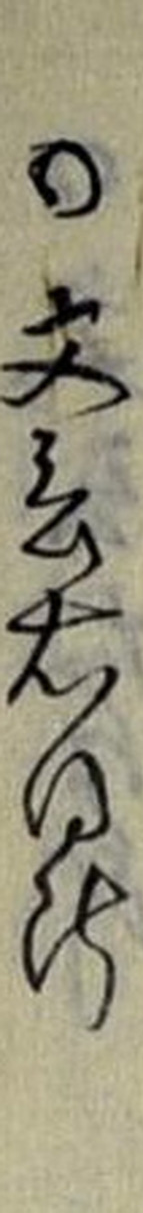〇文言右同断
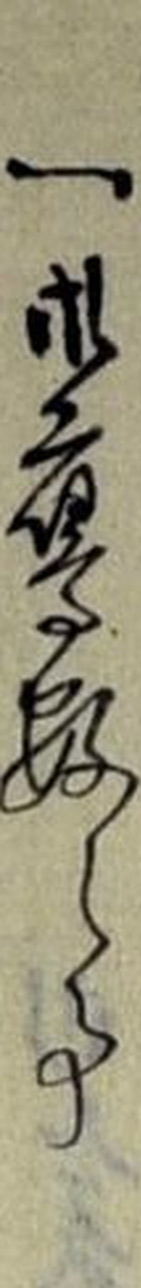一御鷹数之事
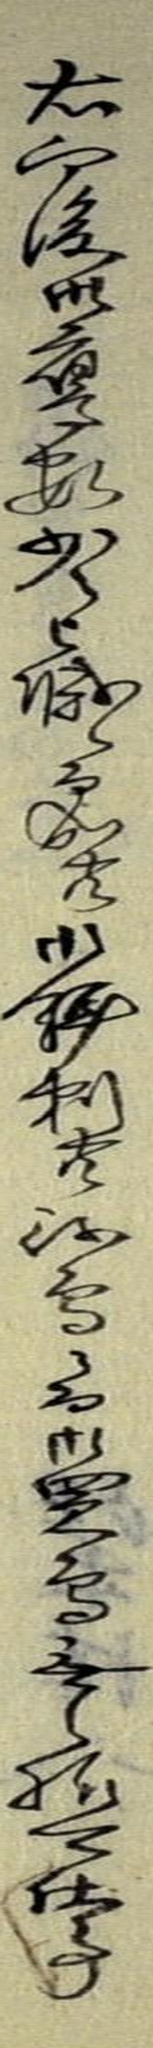右向後御鷹数少々被減候而成共御餌刺共役鳥❓ニ而御買鳥無之様可仕事
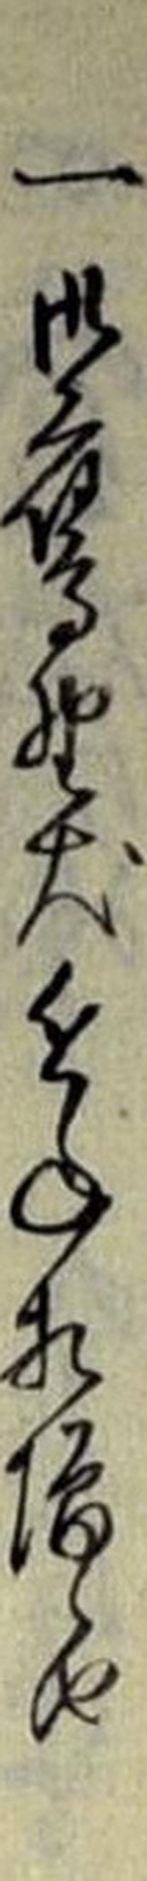一御鷹野犬近年相増候由
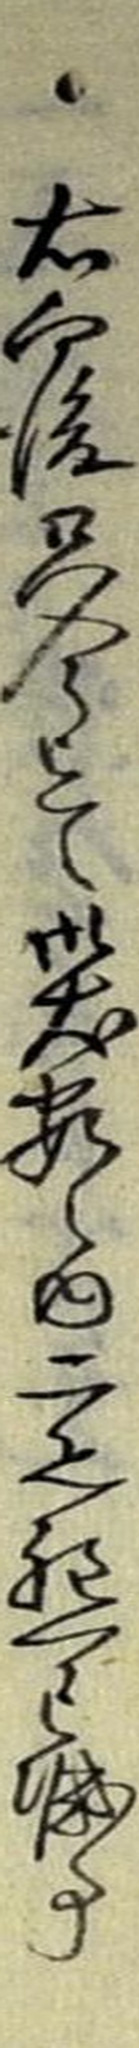右向後只今迄之御犬数之内二疋程可被減事
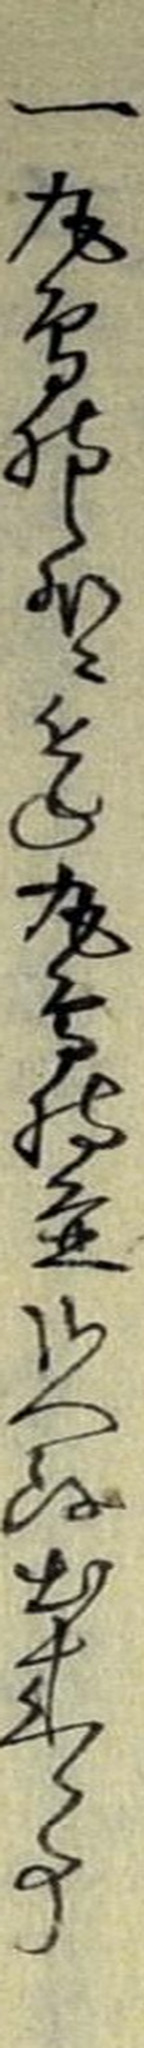一丸鳥持之外ニ近年丸鳥持並弐人致出来候事
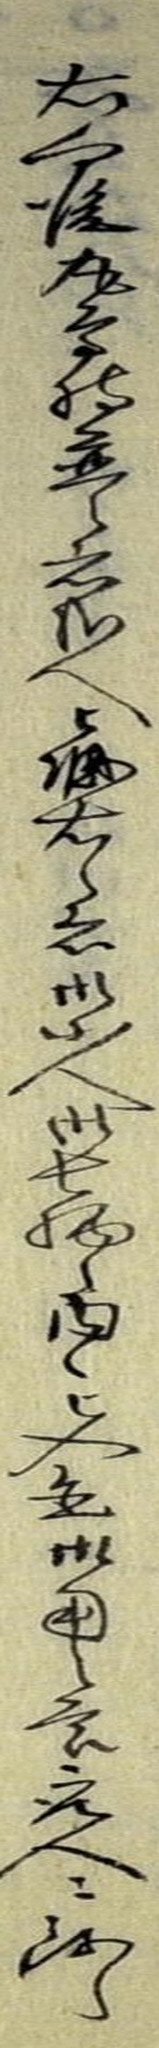右向後丸鳥持並之者弐人被減右之者御小人御長柄之内へ被入置御用之節取人ニ致し
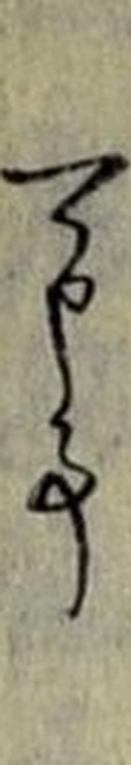可申事
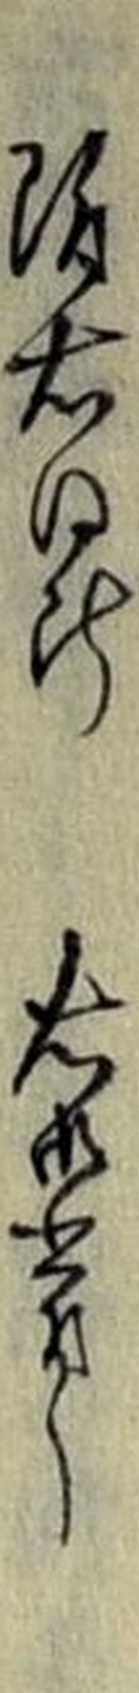附右同断右御書付之
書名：命令之部 一
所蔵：福井県文書館 Fukui Prefectural Archives
